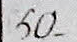50
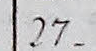27
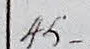45
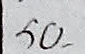50
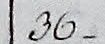36
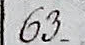63
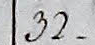32
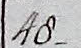48
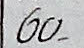60
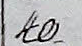40
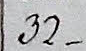32
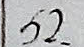52
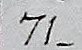71
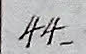44
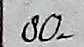80
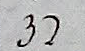32
